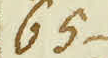65
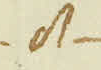8
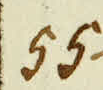55
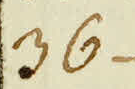36
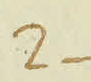2
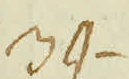39
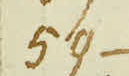59
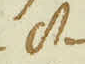8
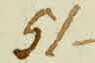51
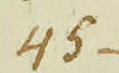45
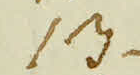13
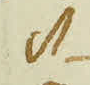8
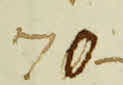70
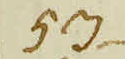53
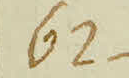62
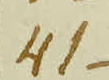41
